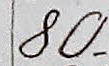80
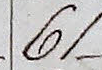61
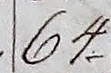64
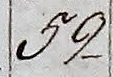59
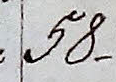58
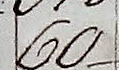60
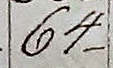64
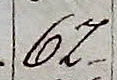62
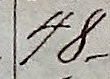48
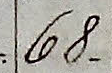68
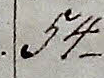54
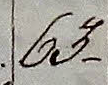63
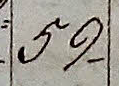59
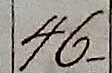46
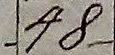48
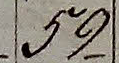59
